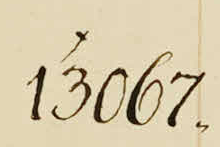13067
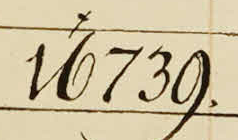16739
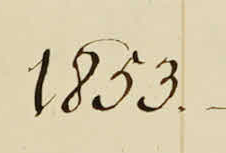1853.
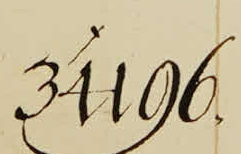34196
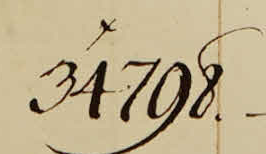34798.
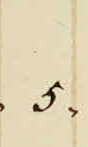5
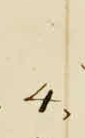4
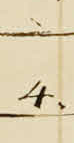4
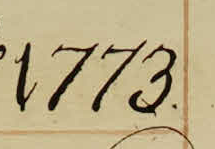1773.
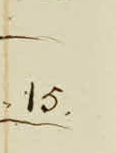15.
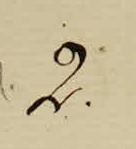2.
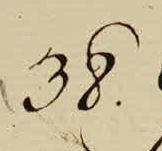38.
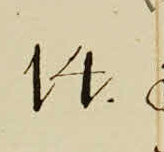14.
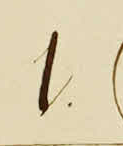1.
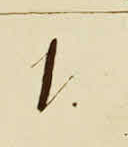1.
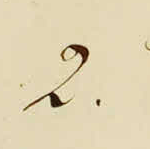2.
